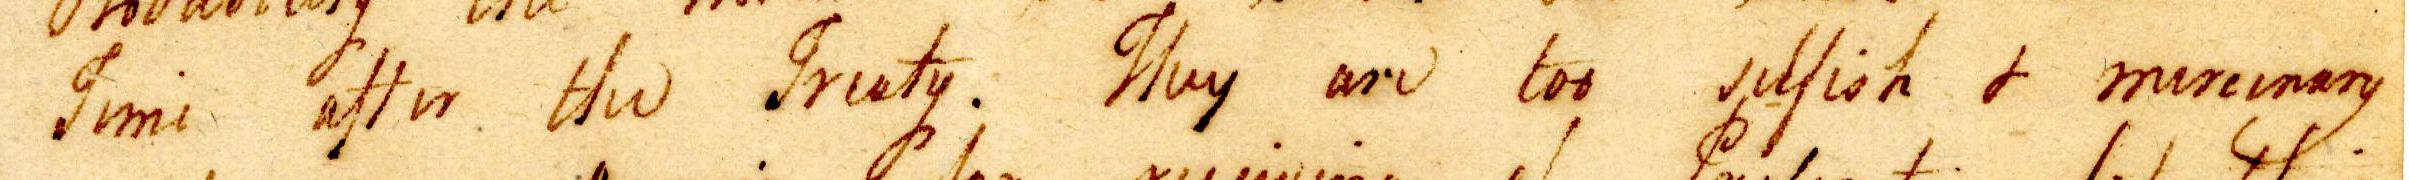Time after the Treaty. They are too selfish & mercenary
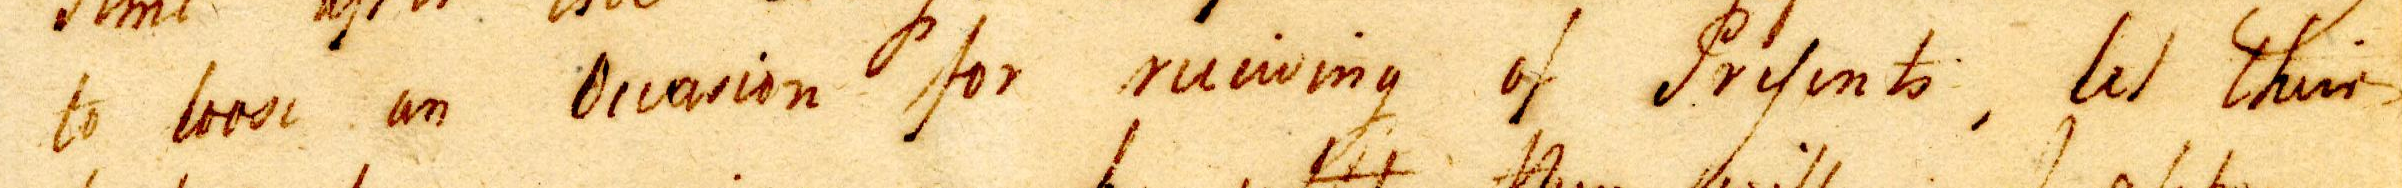to loose an Occasion for receiving of Presents, let their
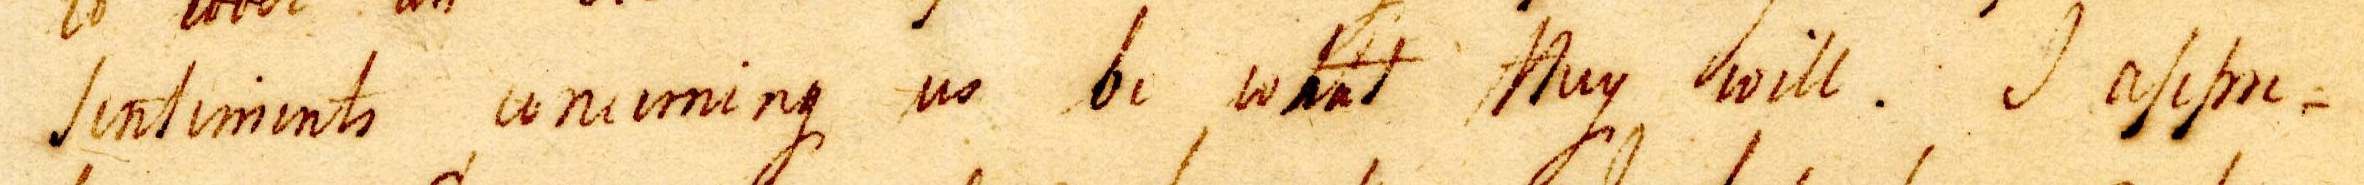Sentiments concerning us be what they will. I appre-
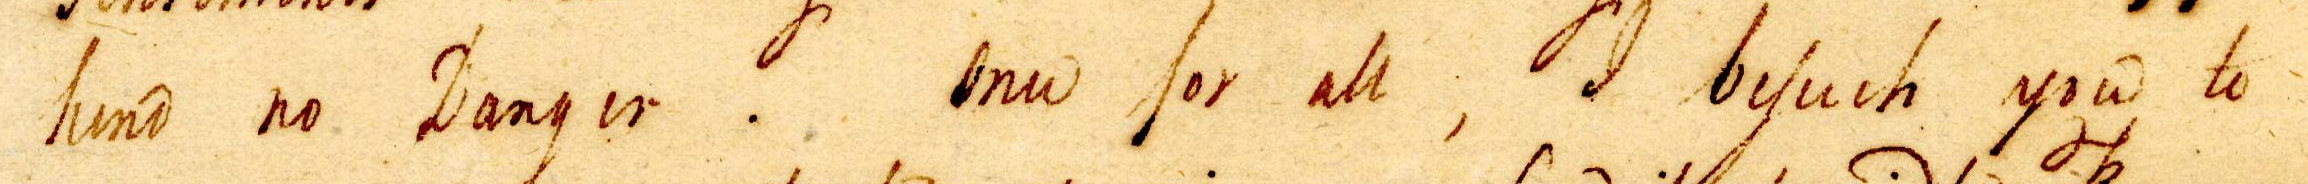hend no Danger. Once for all, I beseech you to
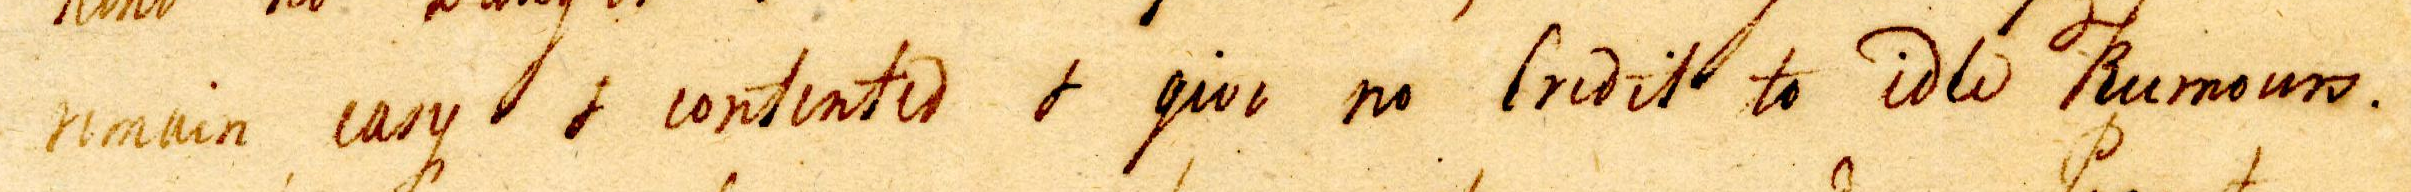remain easy & contented & give no Credit to idle Rumours.
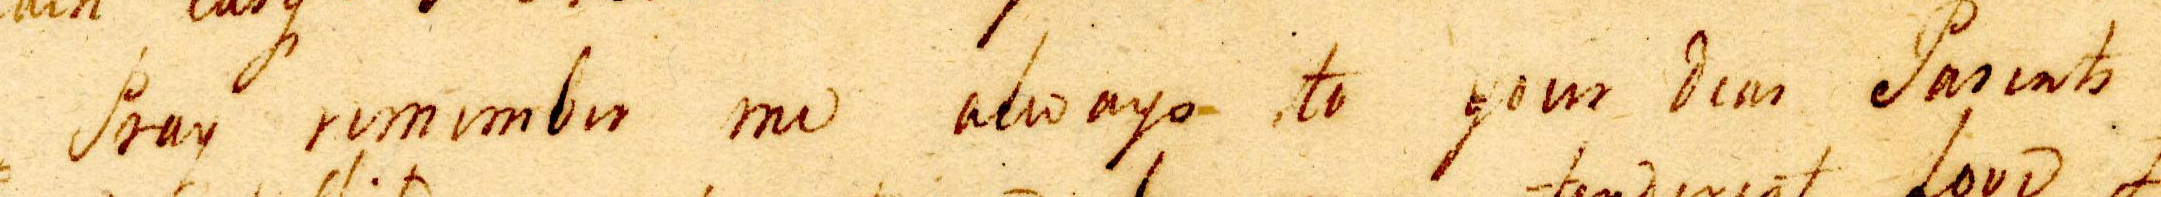Pray remember me always to your dear Parents
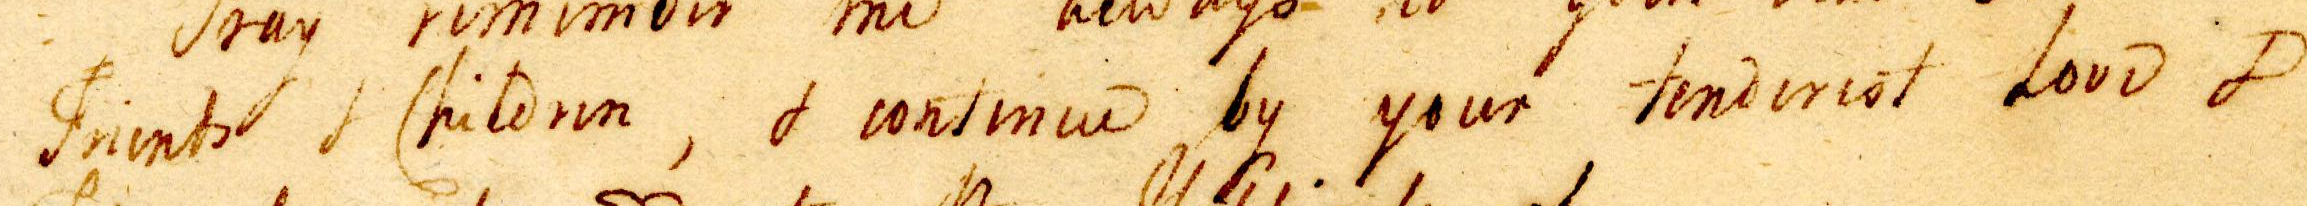Friends & Children, & continue by your tenderest Love &
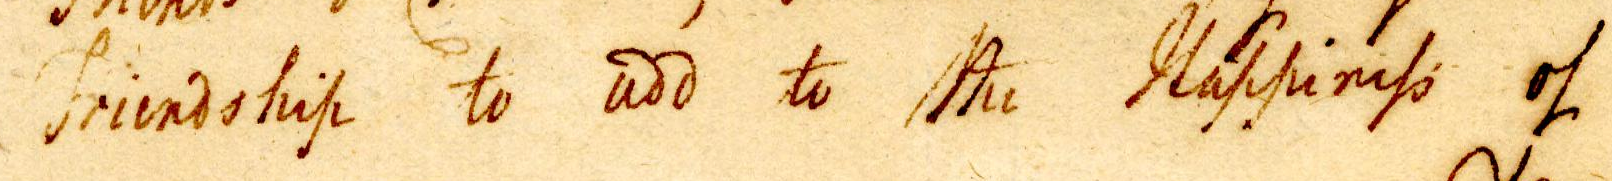Friendship to add to the Happiness of
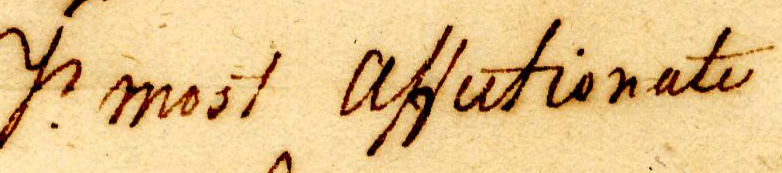J: Yeates
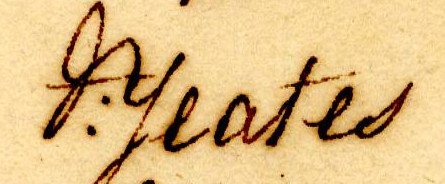J: Yeates
